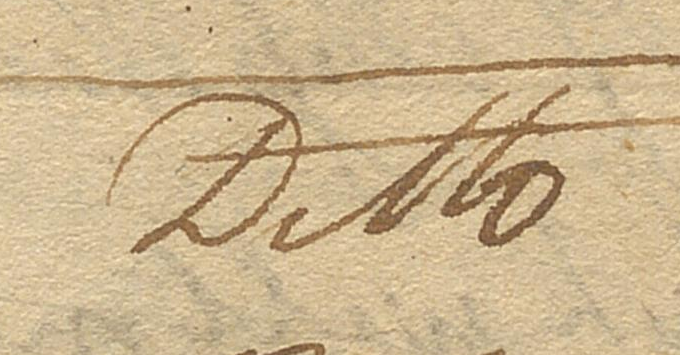Ditto
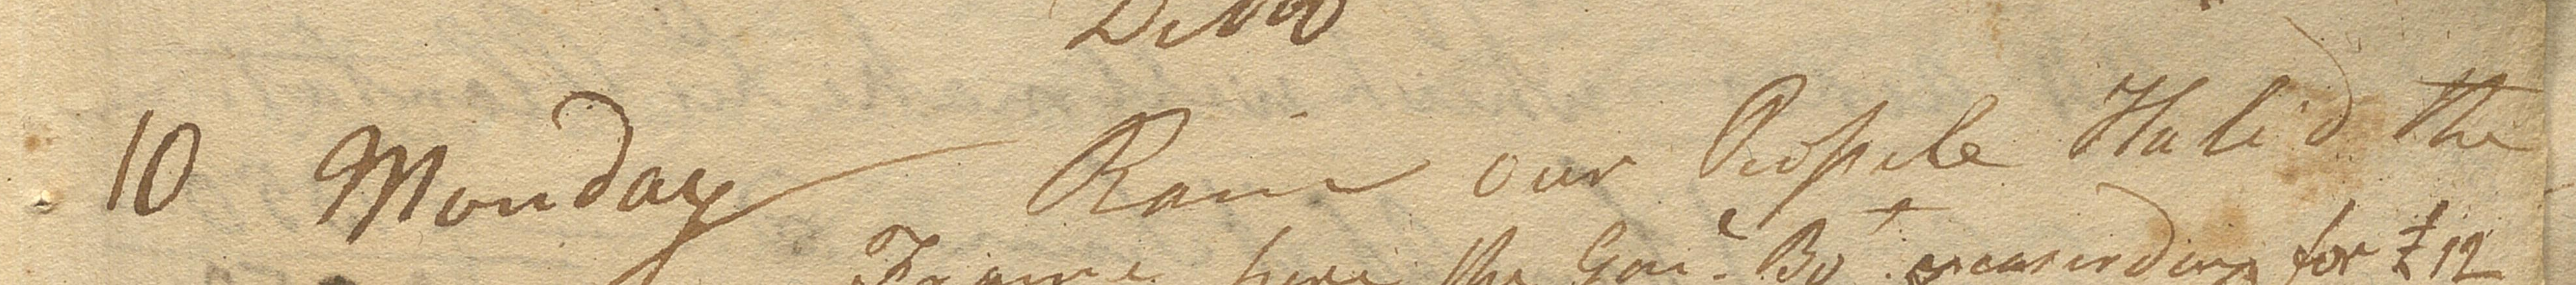10 Monday, Rain our People Hale'd the
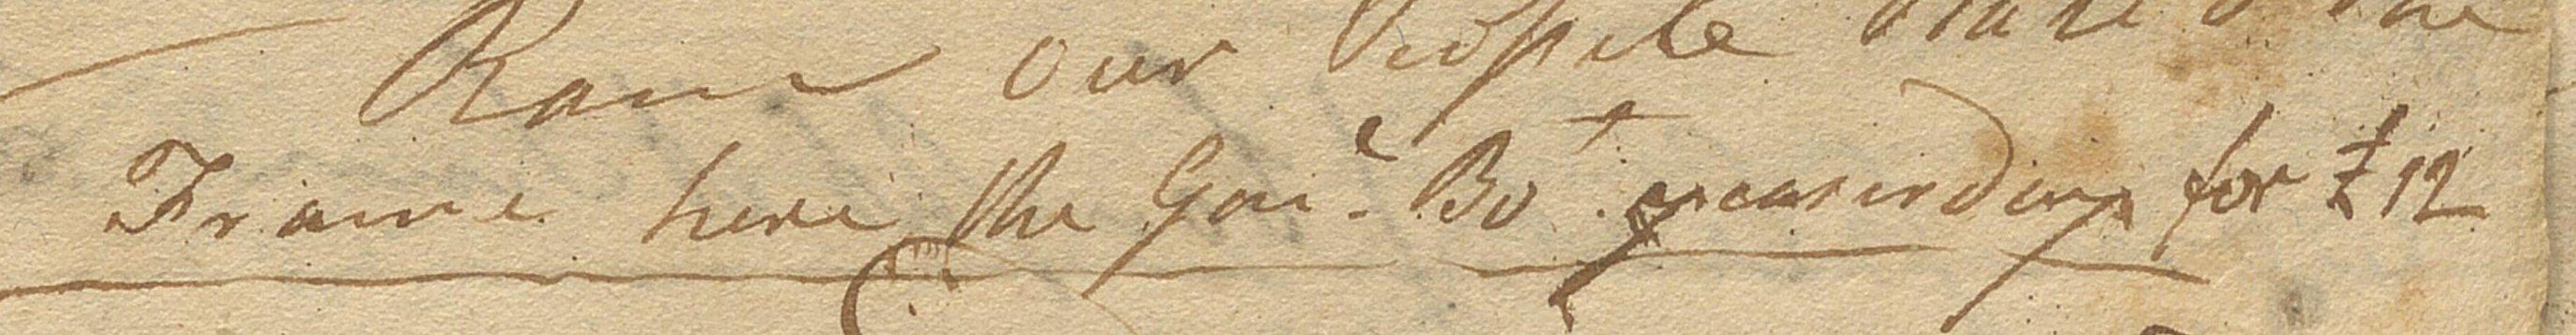Frame here the Gen^l. Bo^t. yeaserday for £12
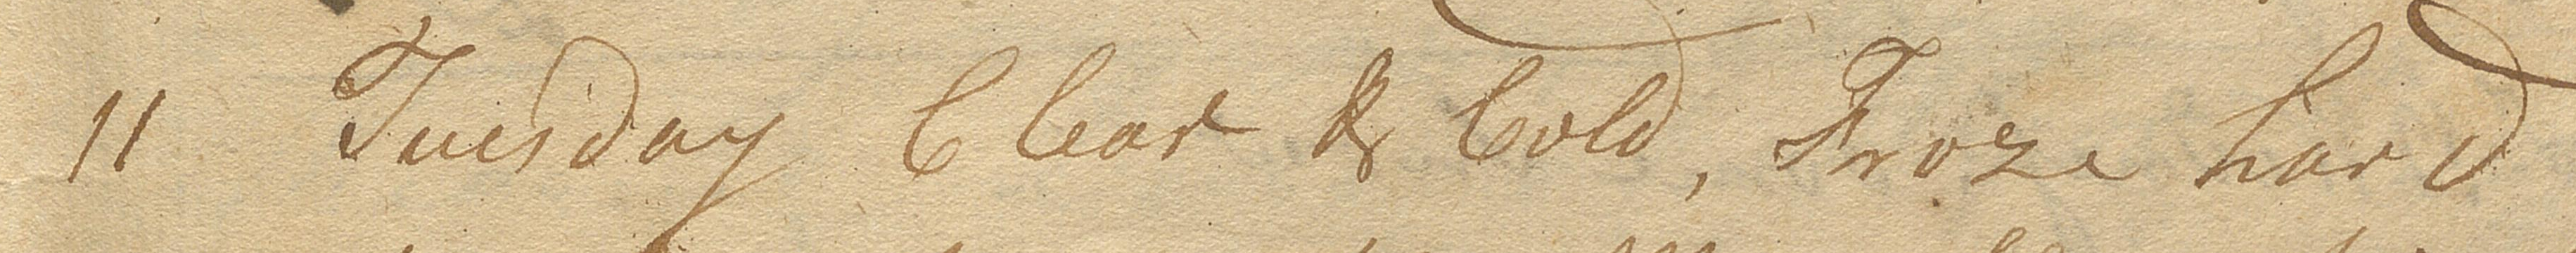11 Tuesday Clear & Cold, Froze hare
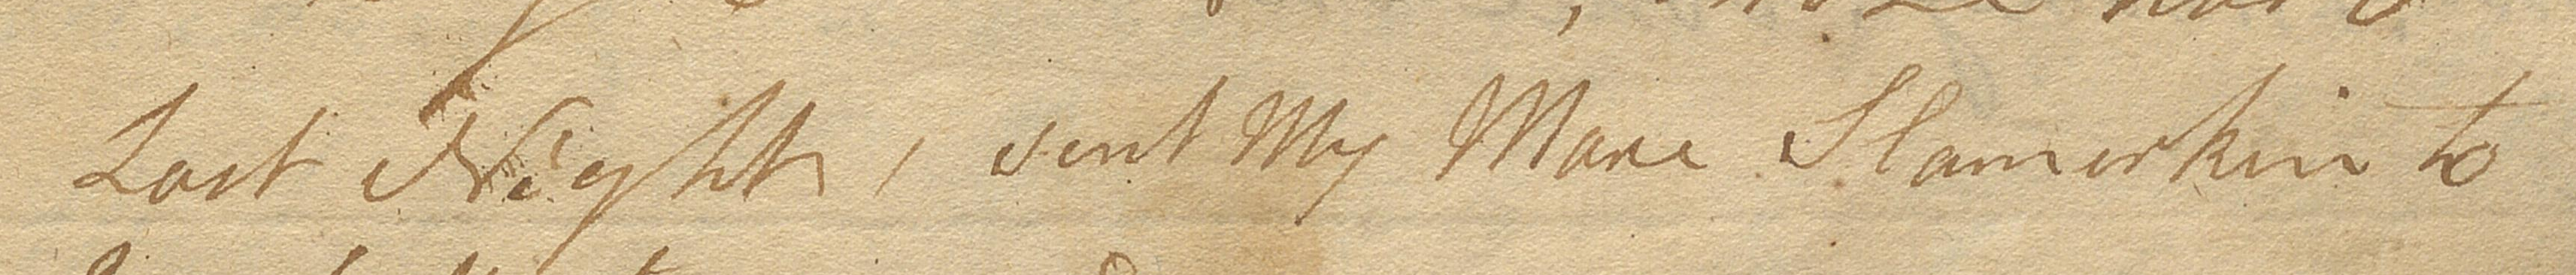Last Night, sent My Mare Slamerkin to
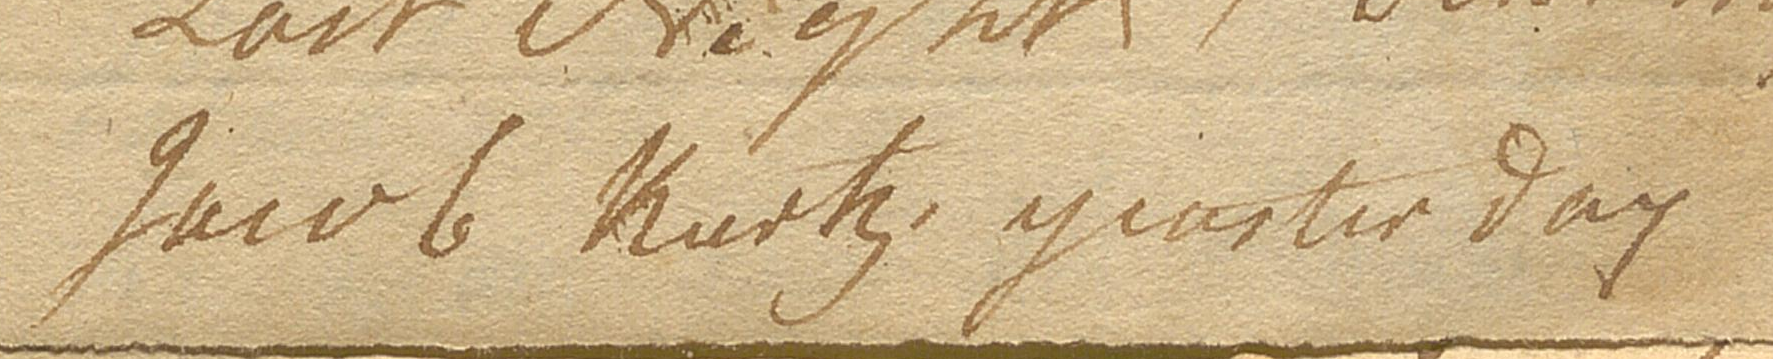Last Night, sent My Mare Slamerkin to
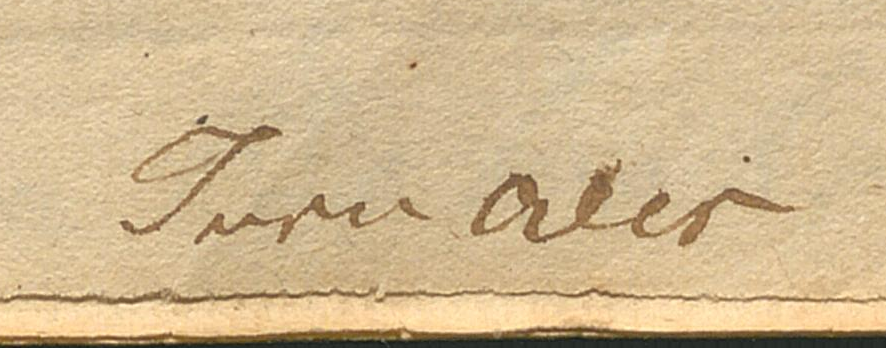Turn over
